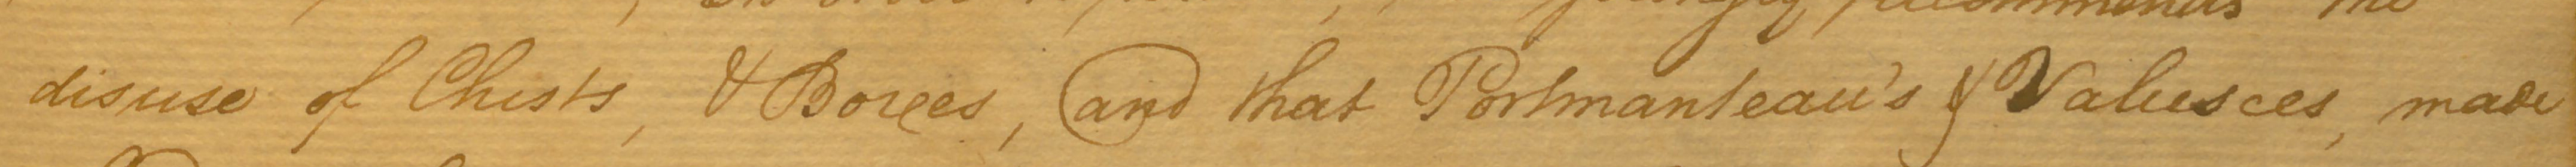disuse of Chests & Boxes, and that Portmanteau's of Valeesces, made
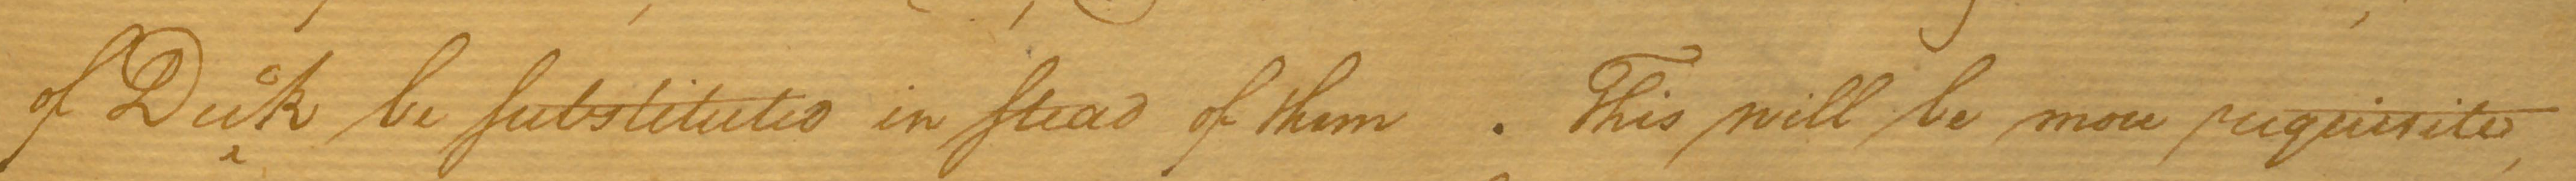of Du^ck be substituted instead of them. This will be more requisite
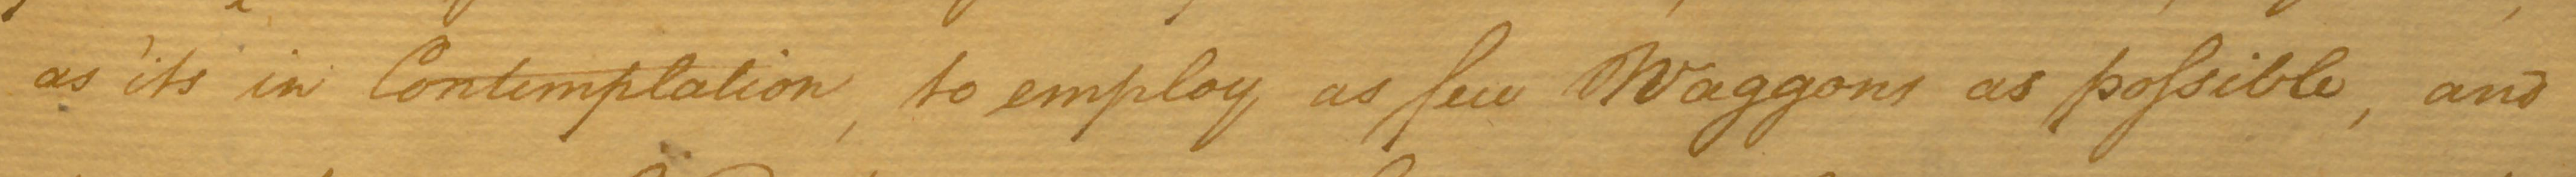as 'its in Contemplation, to employ as few Waggons as possible, and
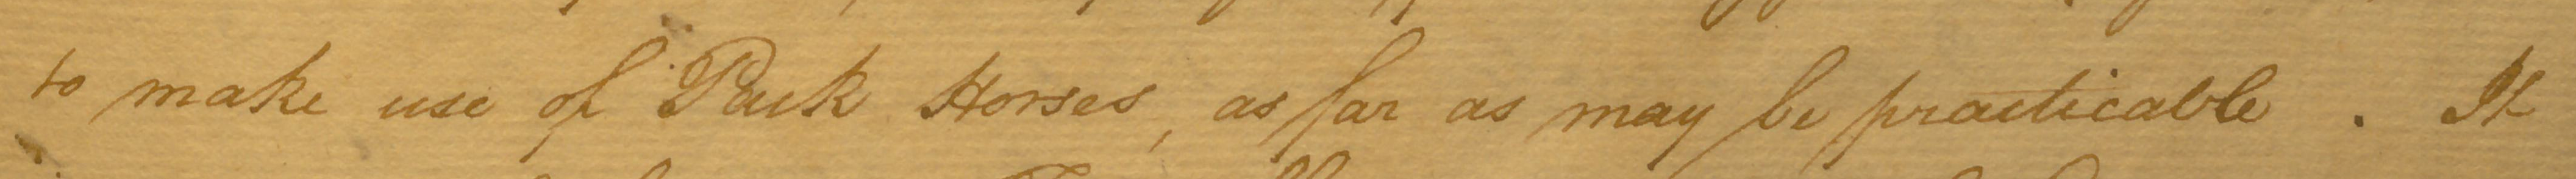to make use of Pack Horses, as far as may be practicable. It
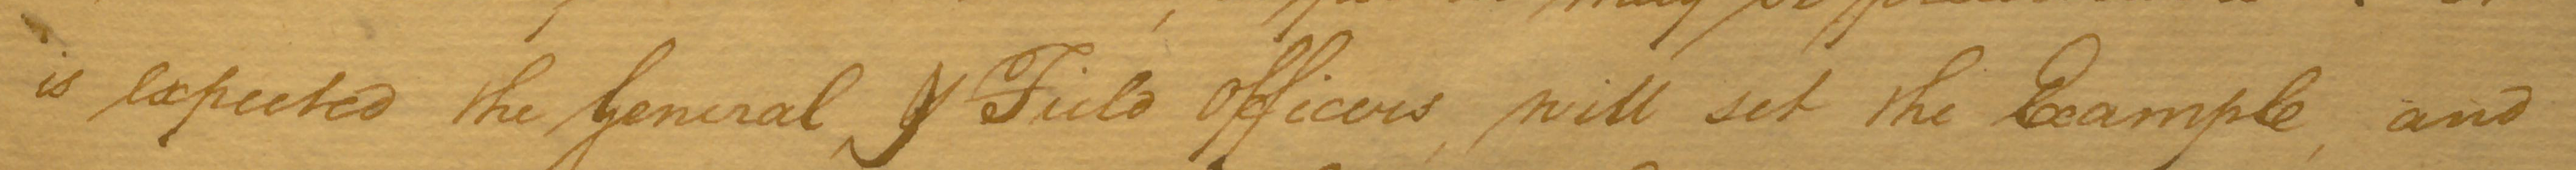is expected the General & Field officers will set the Example and
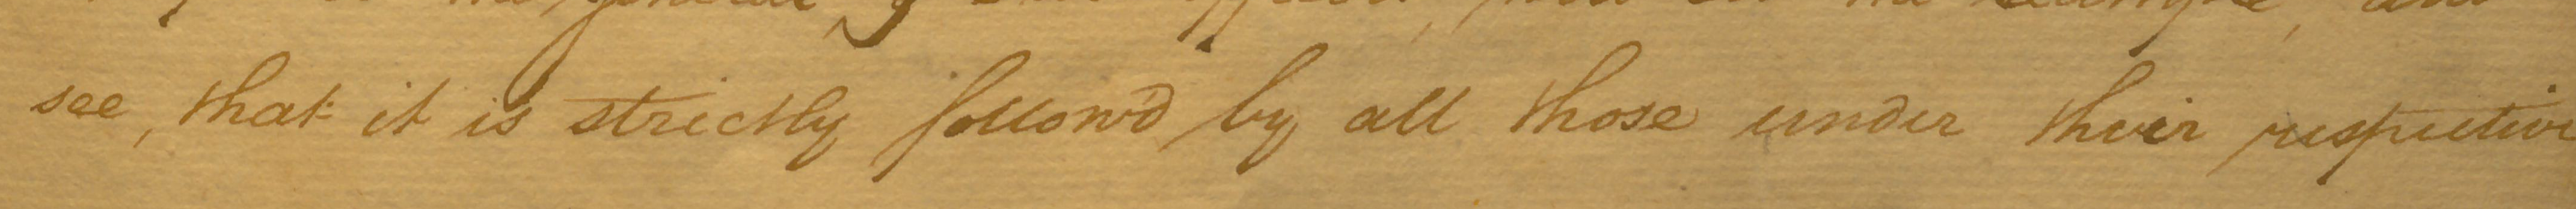see, that it is strictly follow'd by all those under their respective
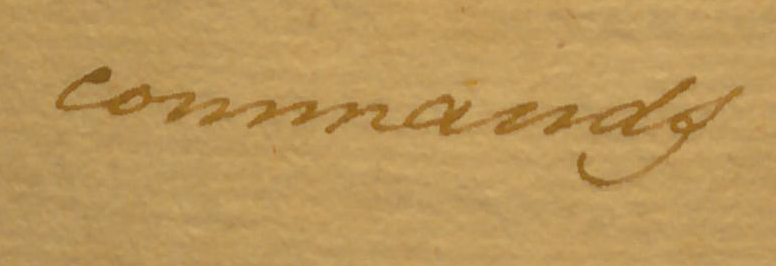commands
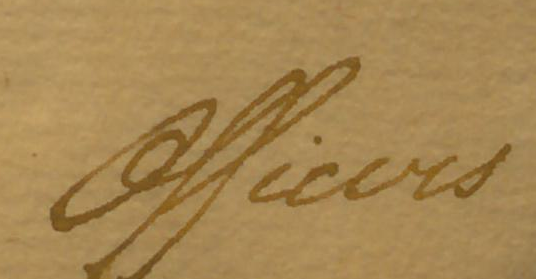Officers
